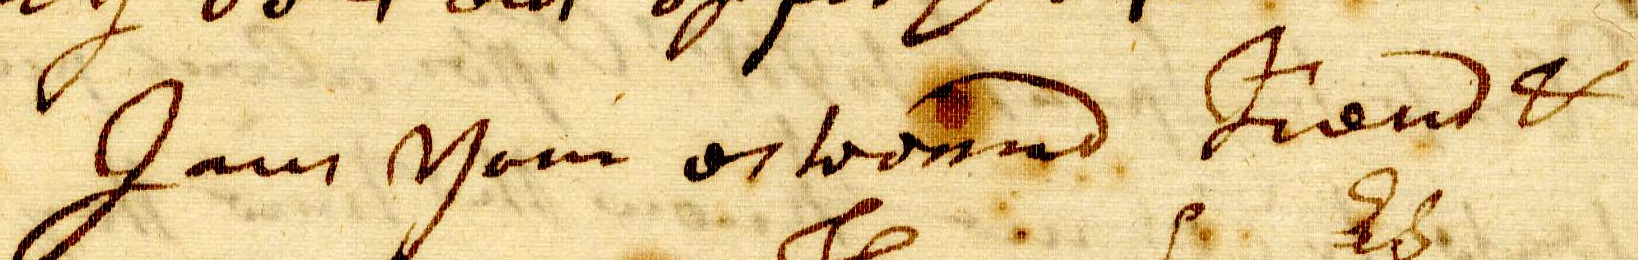I am Your esteemed Friend &
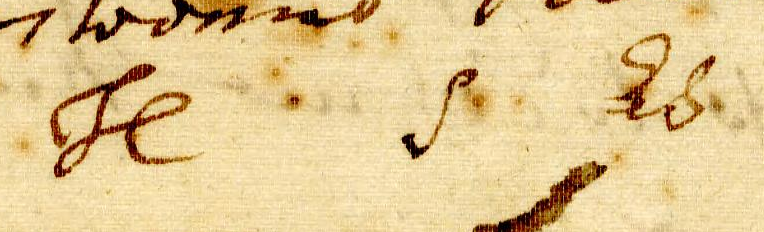H S ES
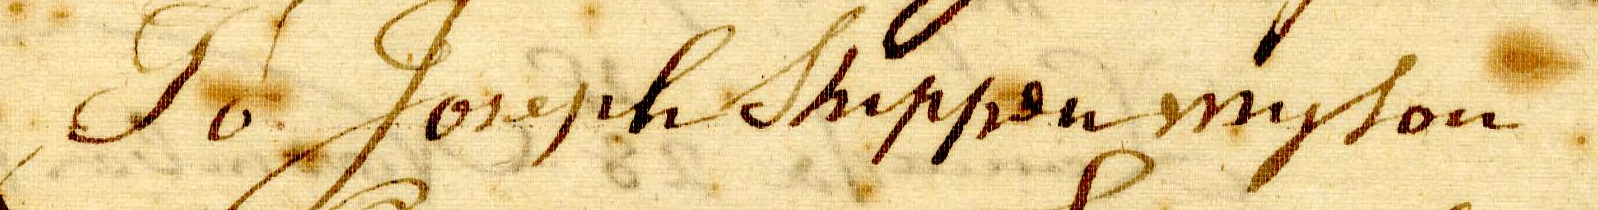To Joseph Shippen My son
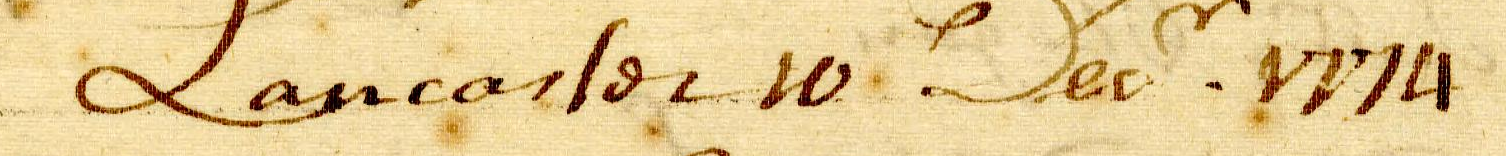Lancaster 10^h Dec^r. 1774
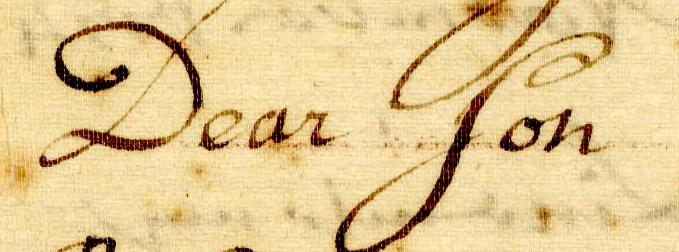Dear Son
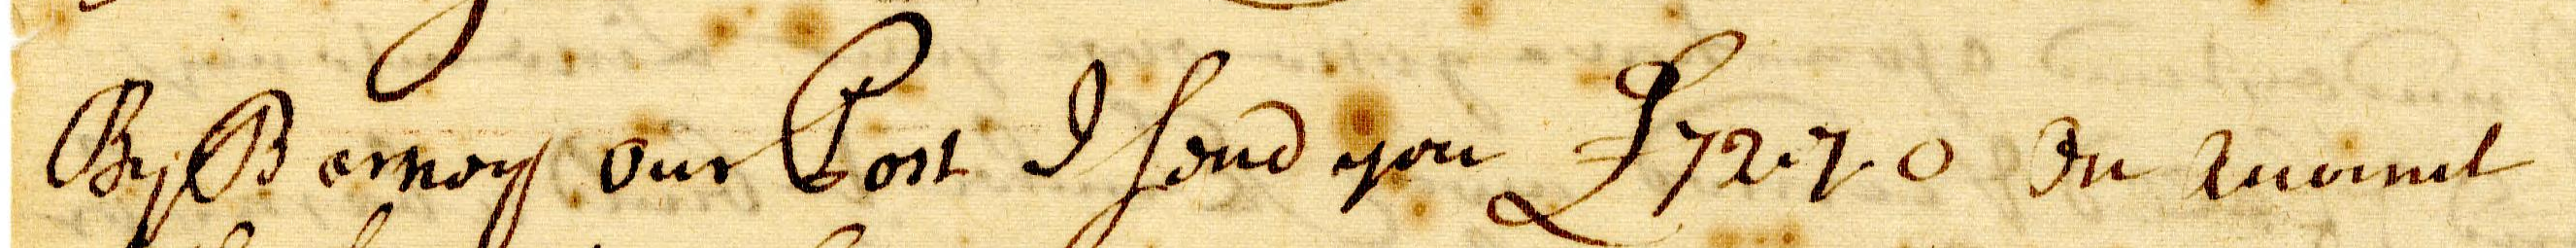By Barney our Post I send you £72.70 On Account
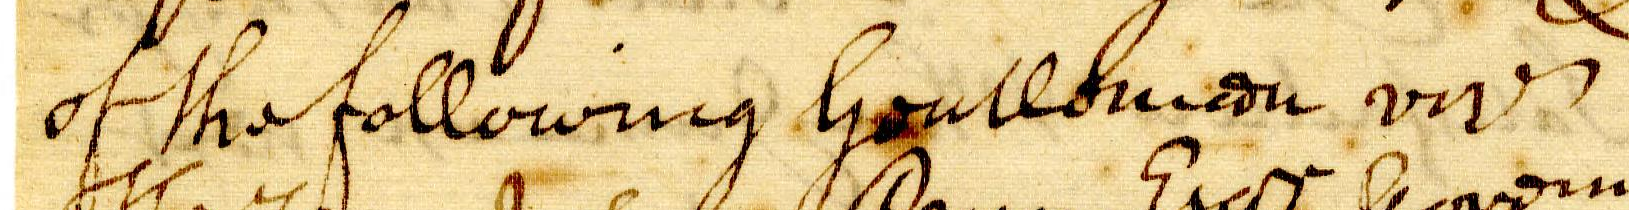of the following Gentlemen viz^t
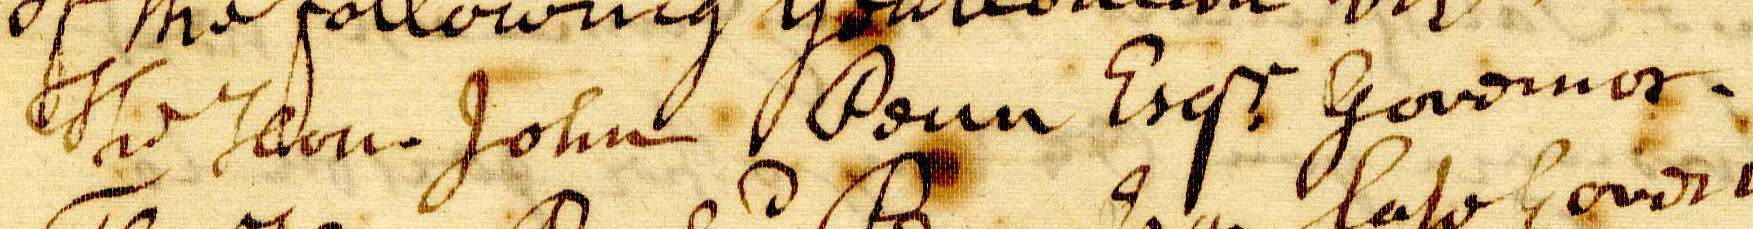The Hon. John Penn Esq^r. Governor.
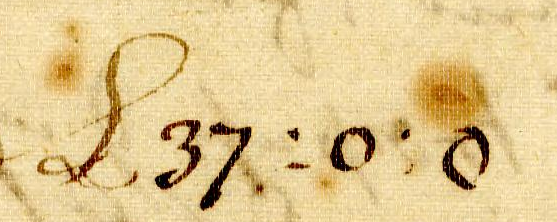£37..0..0
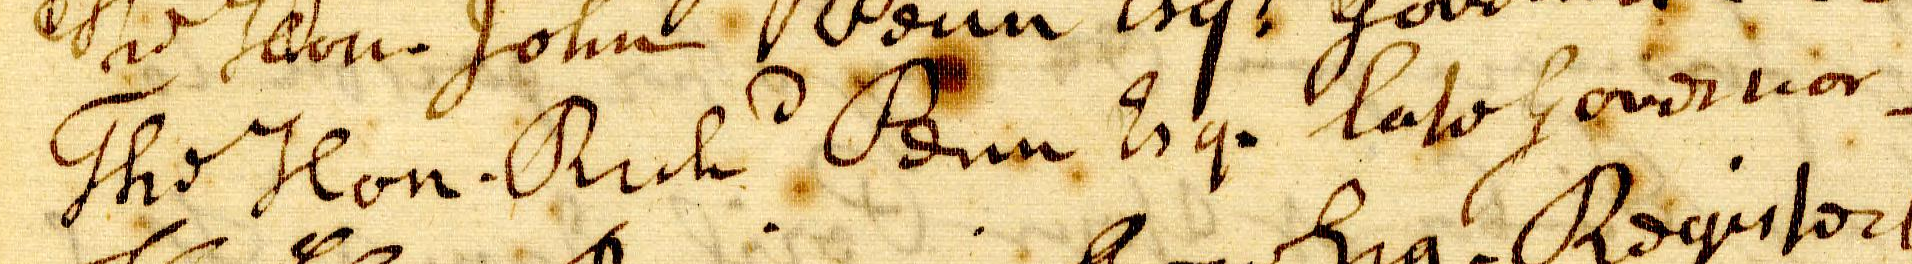The Hon. Rrch^d Penn Esq. late Governor
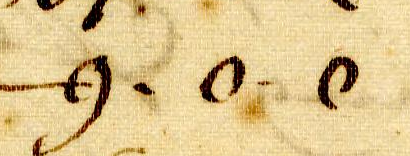9.0.0
